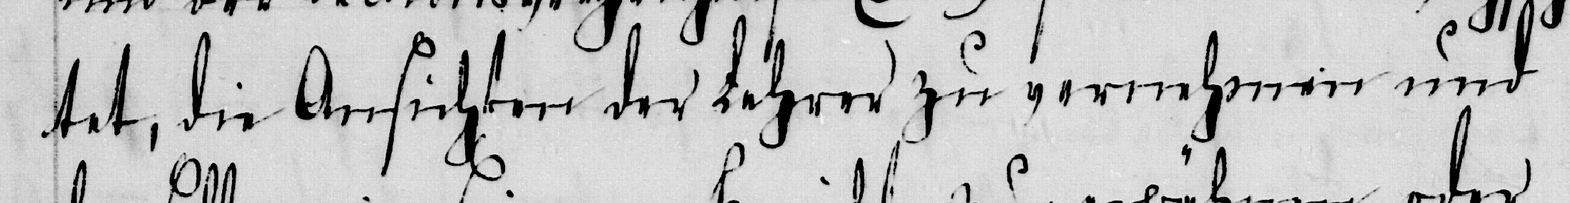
tet, die Ansichten der Lehrer zu vernehmen und
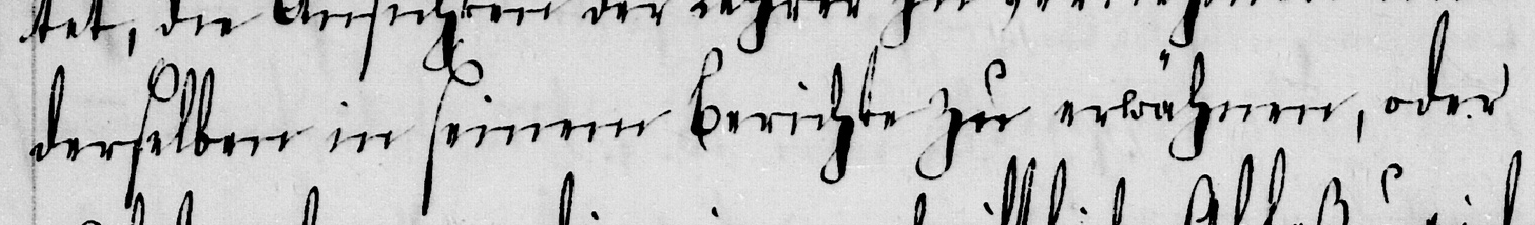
derselben in seinem Berichte zu erwähnen, oder
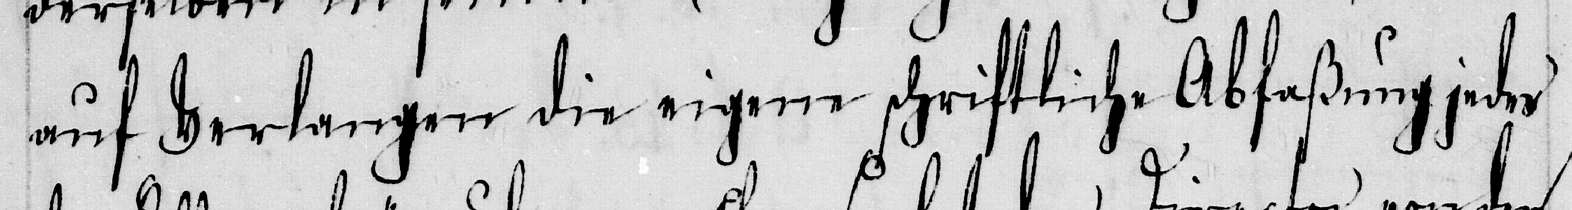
auf Verlangen die eigene schriftliche Abfaßung jeder
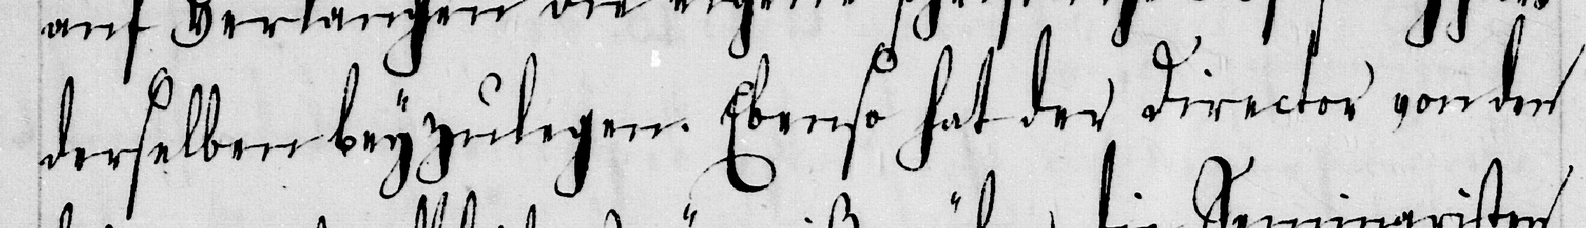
derselben beyzulegen. Ebenso hat der Director von den
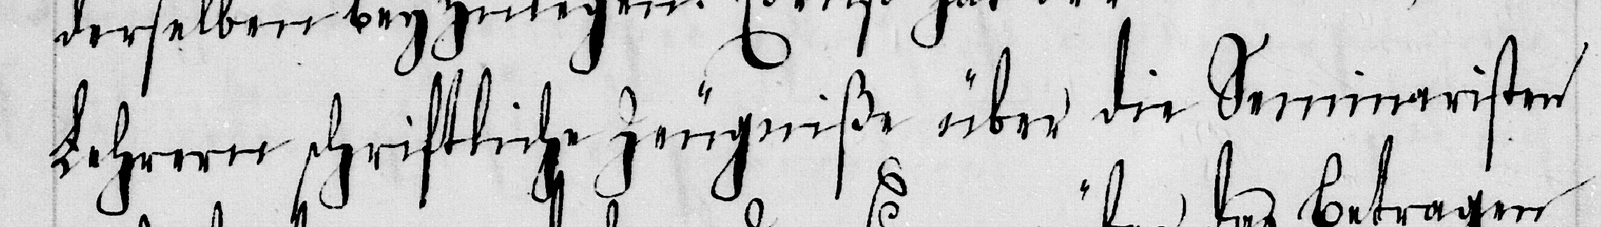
Lehrern schriftliche Zeugniße über die Seminaristen
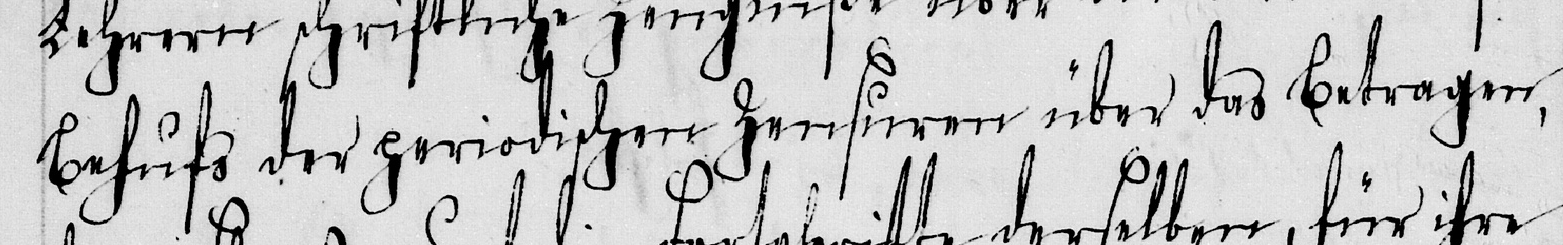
Behufs der periodischen Zensuren über das Betragen,
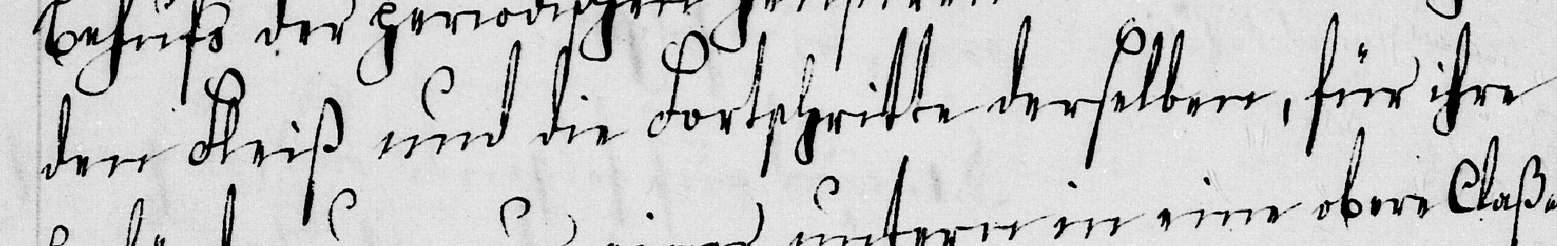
den Fleiß und die Fortschritte derselben, für ihre
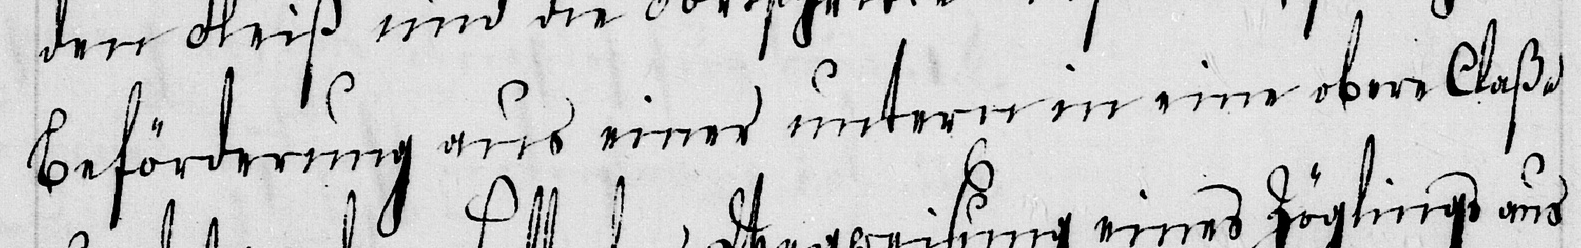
Beförderung aus einer untern in eine obere Claßa
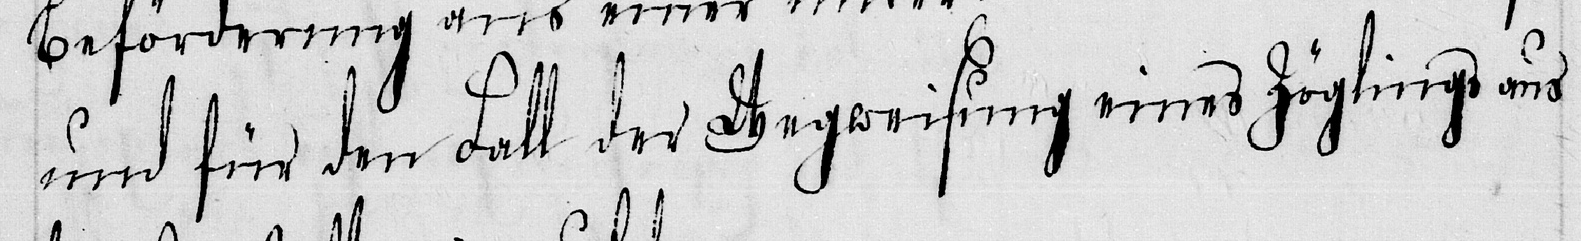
und für den Fall der Wegweisung eines Zöglings aus
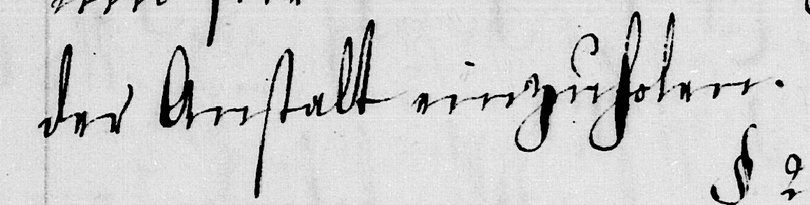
der Anstalt einzuholen.
